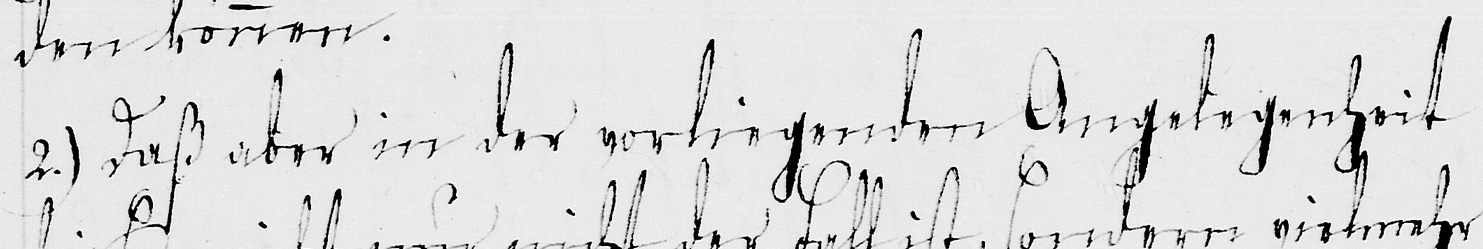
2.) Daß aber in der vorliegenden Angelegenheit
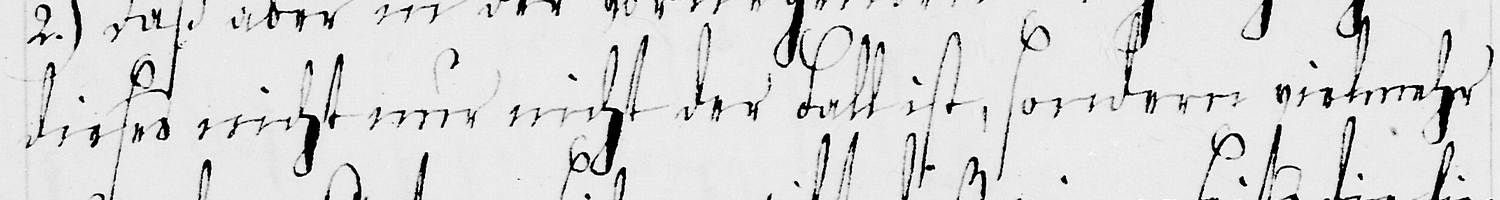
dieses nicht nur nicht der Fall ist, sondern vielmehr
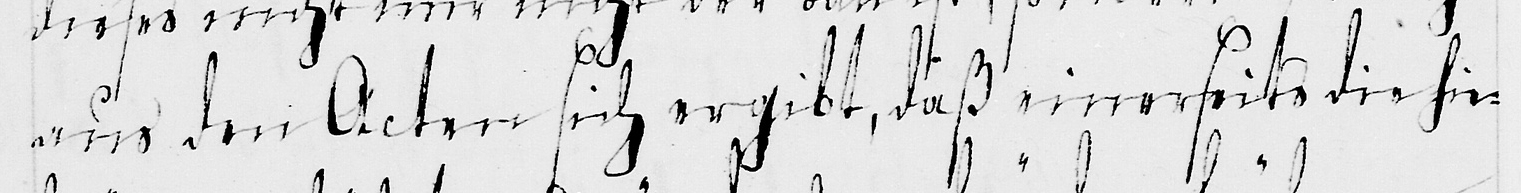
aus den Acten sich ergibt, daß einerseits die hi¬
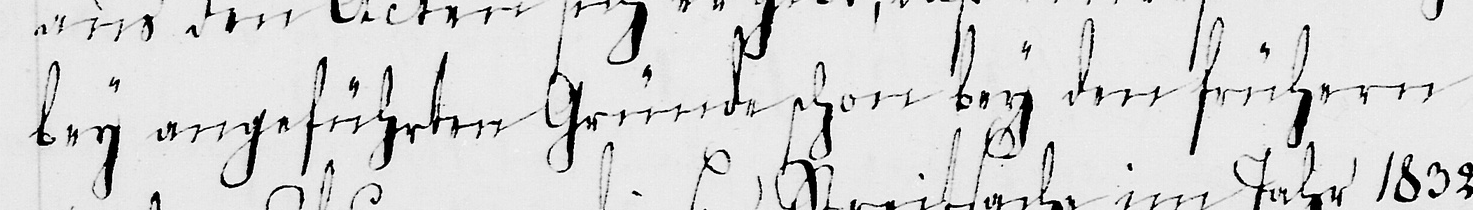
ebey angeführten Gründe schon bey den frühern
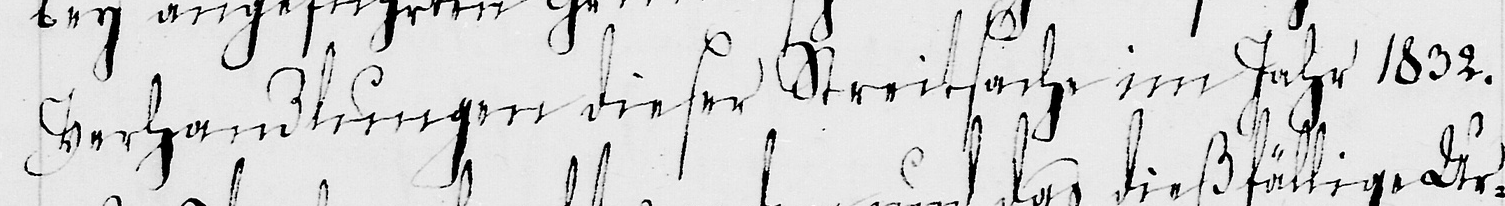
Verhandlungen dieser Streitsache im Jahr 1832.
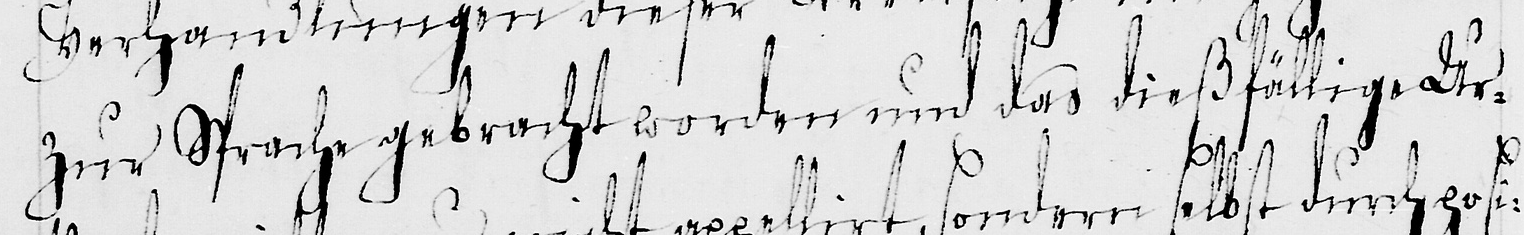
zur Sprache gebracht worden und das dießfällige Ur¬
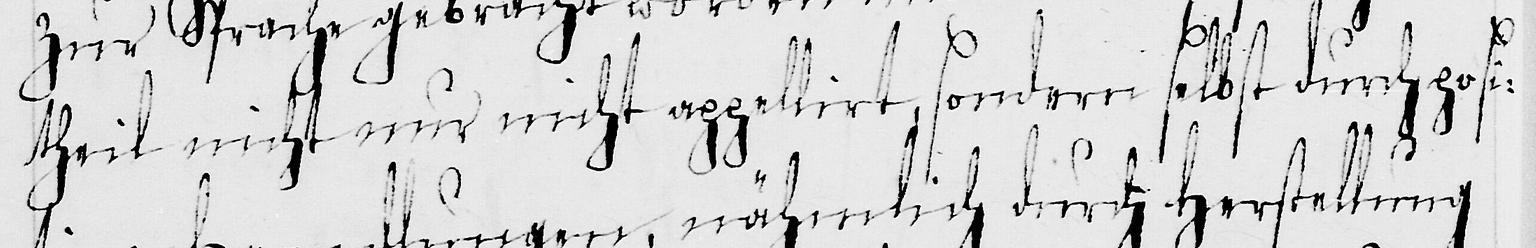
theil nicht nur nicht appellirt, sondern selbst durch pos¬
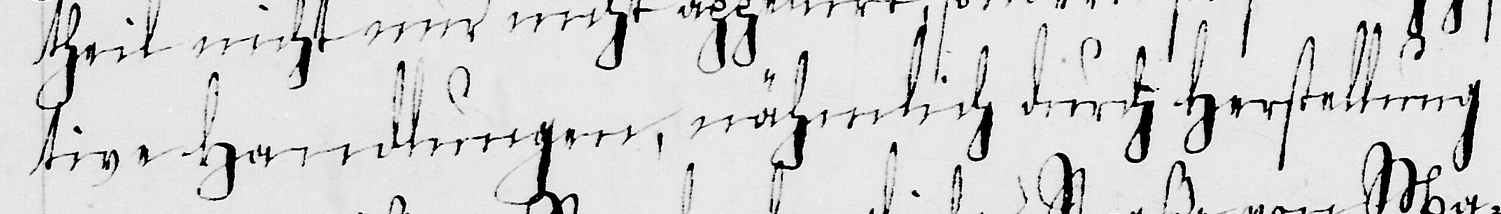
itive Handlungen, nämlich durch Herstellung
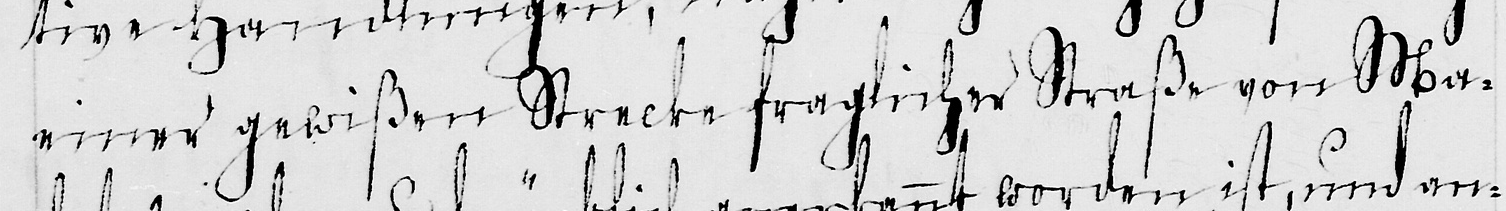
einer gewißen Strecke fraglicher Straße von Ma¬
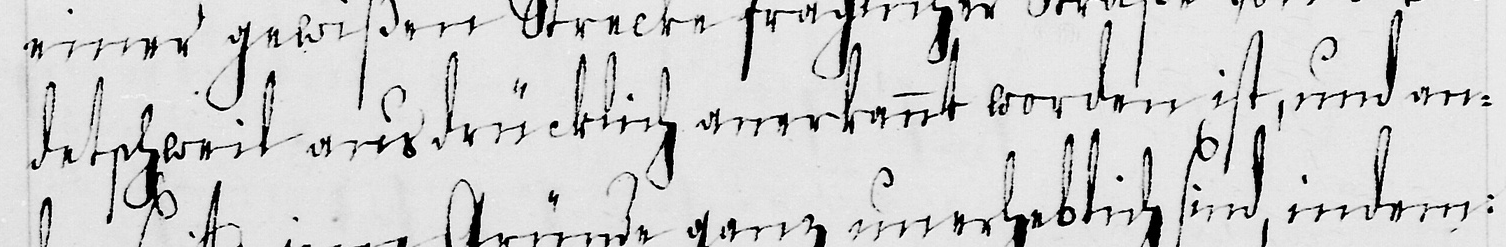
detschweil ausdrücklich anerkannt worden ist, und an¬
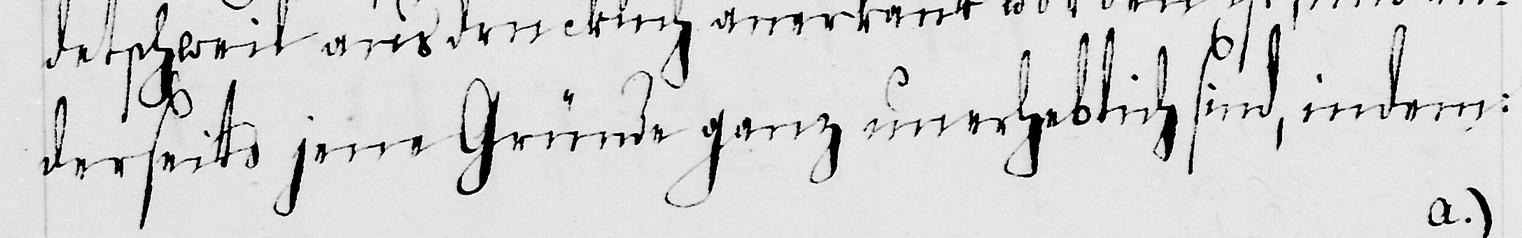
derseits jene Gründe ganz unerheblich sind, indem:
